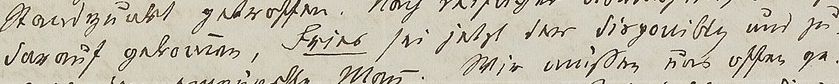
darauf gekommen, Fries sei jetzt der Disponible und zu
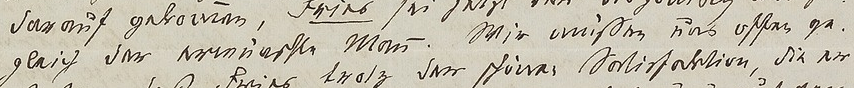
gleich der erwünschte Mann. Wir müssen uns offen ge-
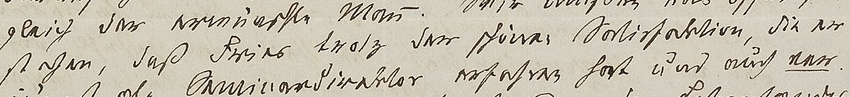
stehen, daß Fries trotz der schönen Satisfaktion, die er
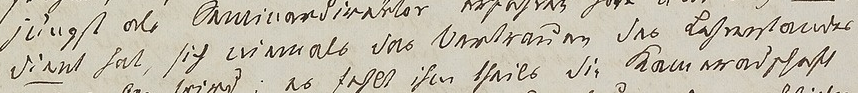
dient hat, sich niemals das Vertrauen des Lehrerstandes
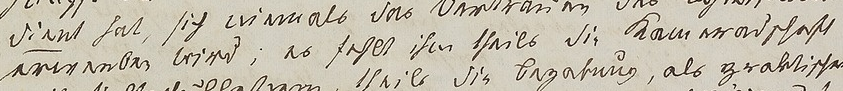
erwerben wird; es fehlt ihm theils die Kameradschaft
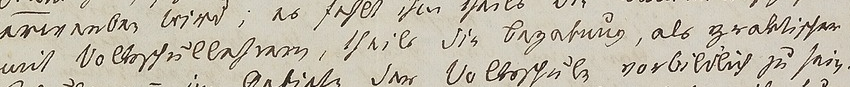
mit Volksschullehrern, theils die Begabung, als praktischer
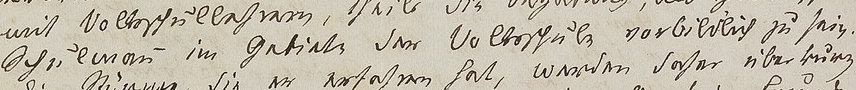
Schulmann im Gebiete der Volksschule vorbildlich zu sein.
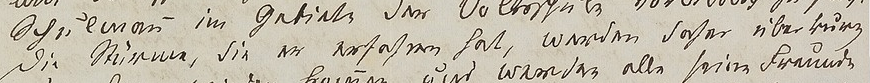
Die Stürme, die er erfahren hat, werden daher über kurz
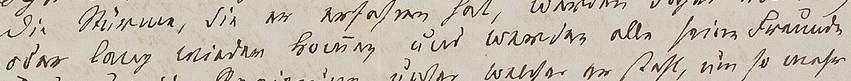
oder lang wieder kommen und werden alle seine Freunde
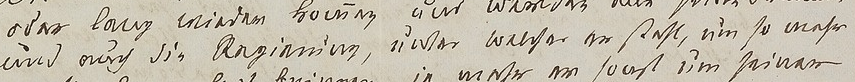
und auch die Regierung, unter welcher er steht, um so mehr
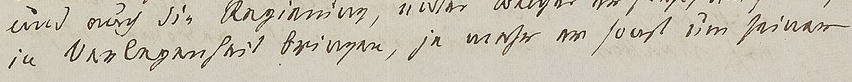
in Verlegenheit bringen, je mehr er sonst um seiner
